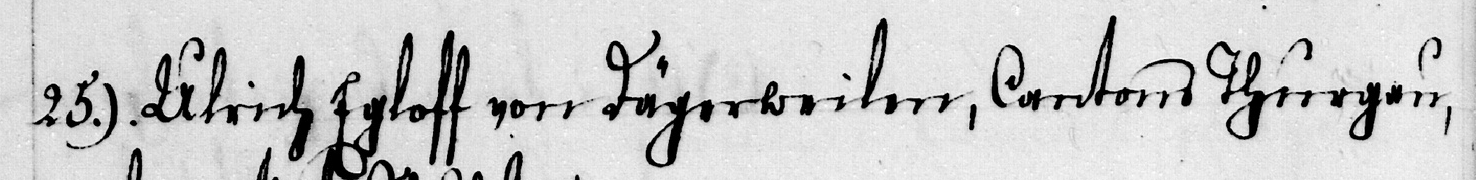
25.) Ulrich Egloff von Dägerweilen, Cantons Thurgau,
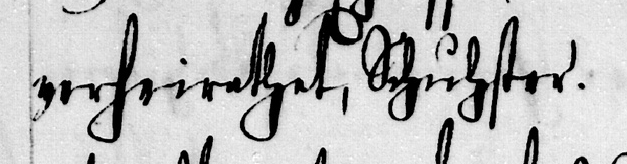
verheirathet, Schuhster.
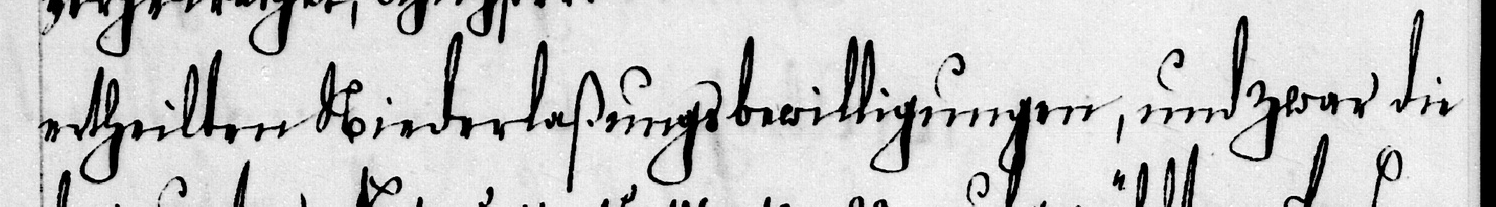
ertheilten Niederlaßungsbewilligungen, und zwar die
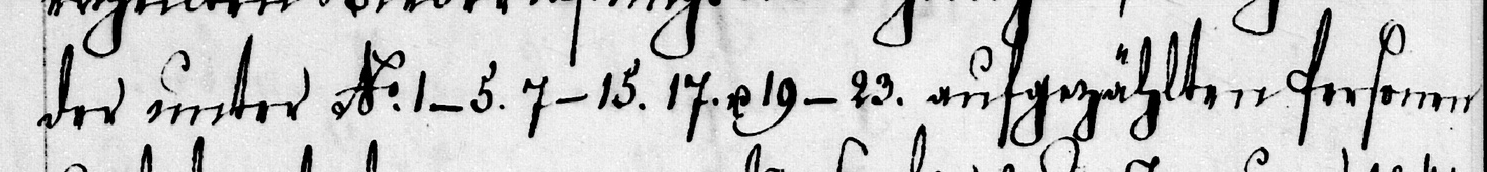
der unter No. 1–5. 7–15. 17. U. 19–23. aufgezählten Personen
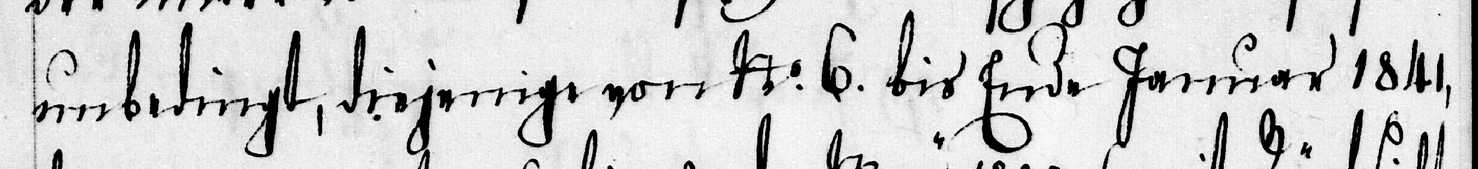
unbedingt, diejenige von No. 6. bis Ende Januar 1841,
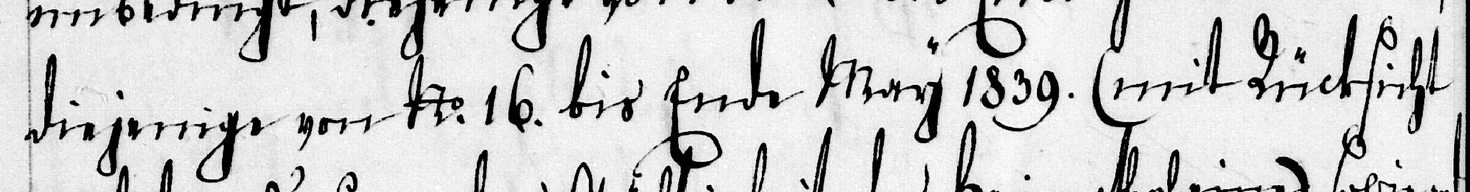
diejenige von No. 16. bis Ende May 1839. (mit Rücksicht
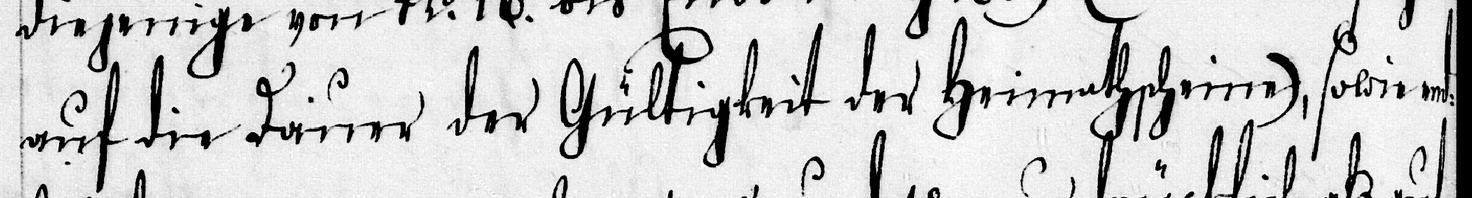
auf die Dauer der Gültigkeit der Heimathscheine), sowie
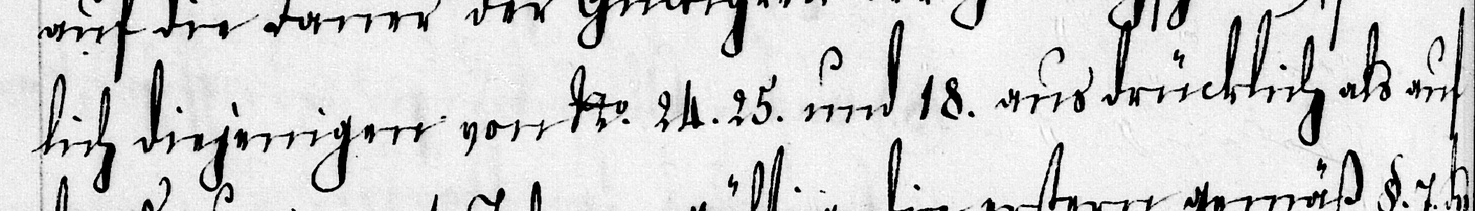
dlich diejenigen von No. 24. 25. und 18. ausdrücklich als auf
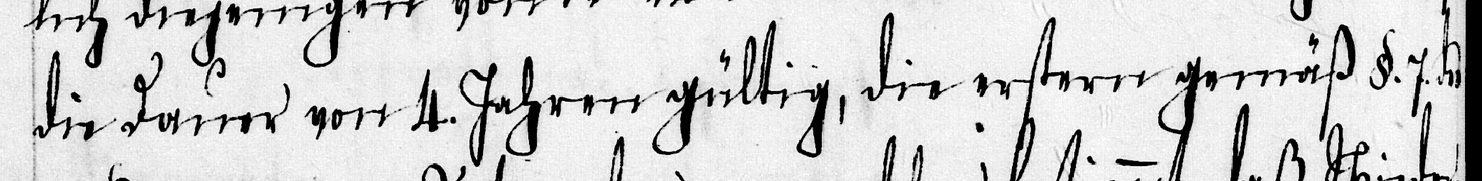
die Dauer von 4. Jahren gültig, die erstern gemäß §. 7. des
